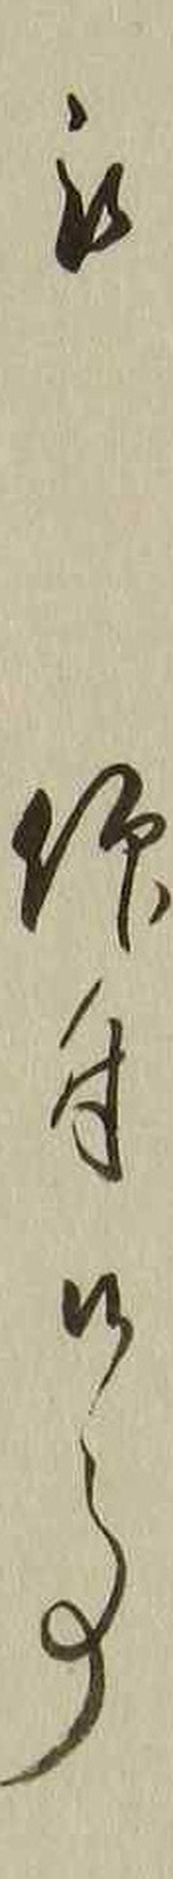被仰付候事
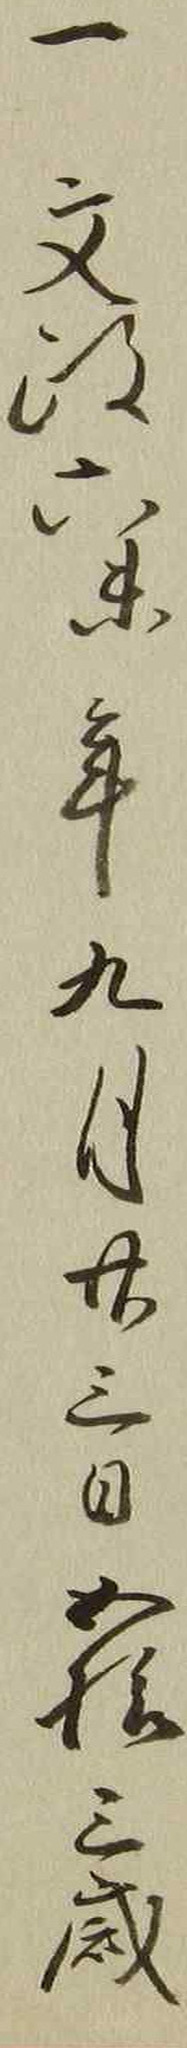一文政六未年九月廿三日五拾三歳
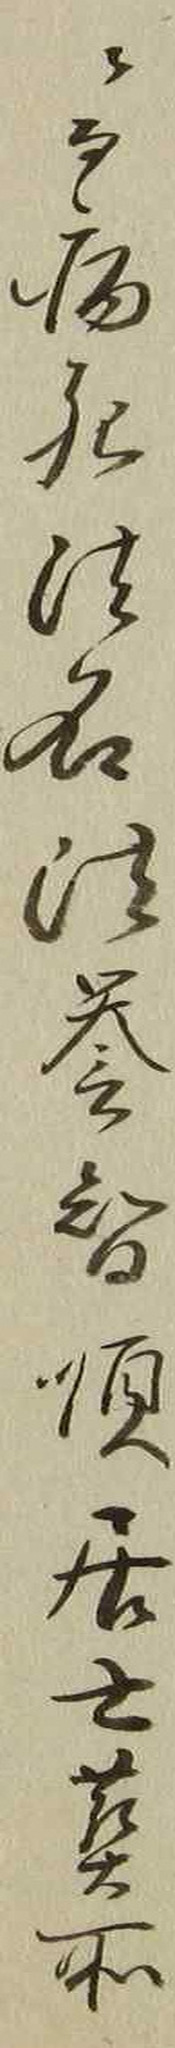ニ而病死法名法誉智順居士葬所
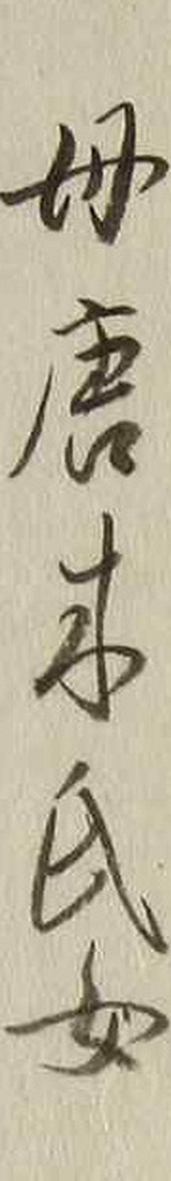母唐木氏女
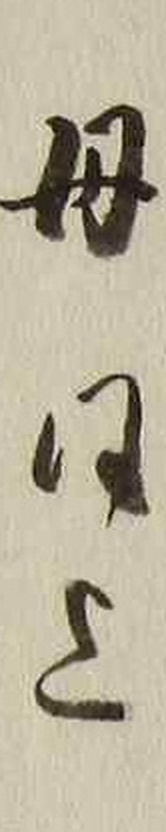母同上
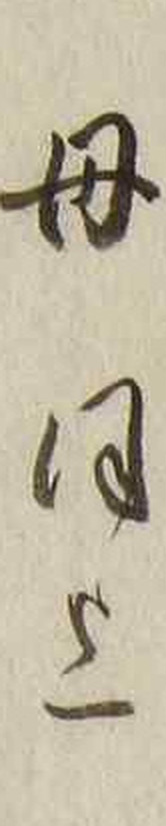母同上

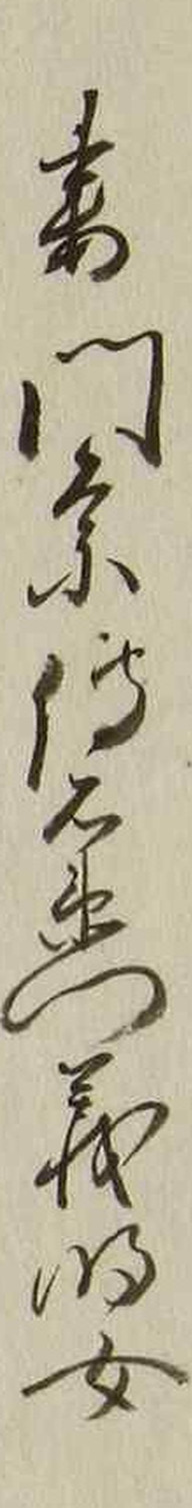妻門原伝右衛門義明女
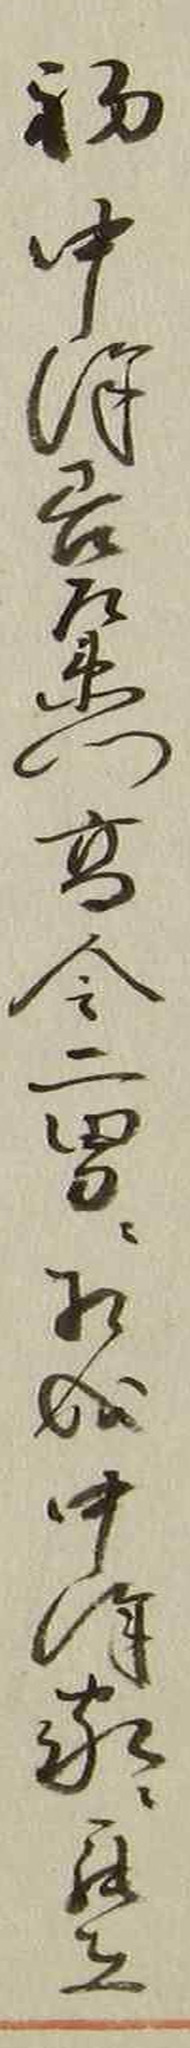初中沢善左衛門高令二男ニ相成中沢家ニ罷在
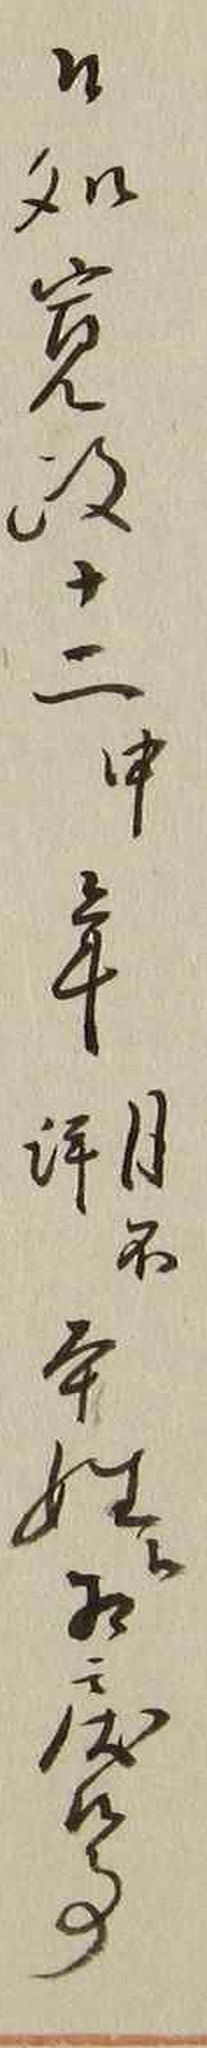候処寛政十二申年月不詳本姓江相戻候事
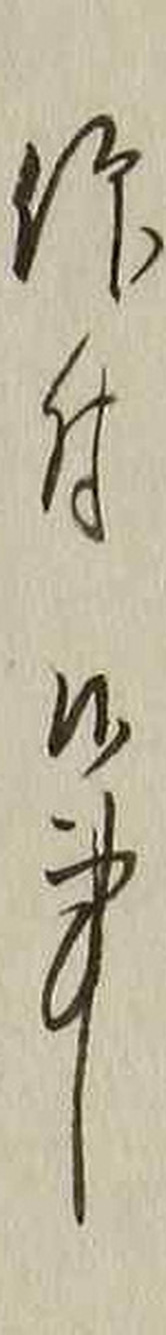仰付候事
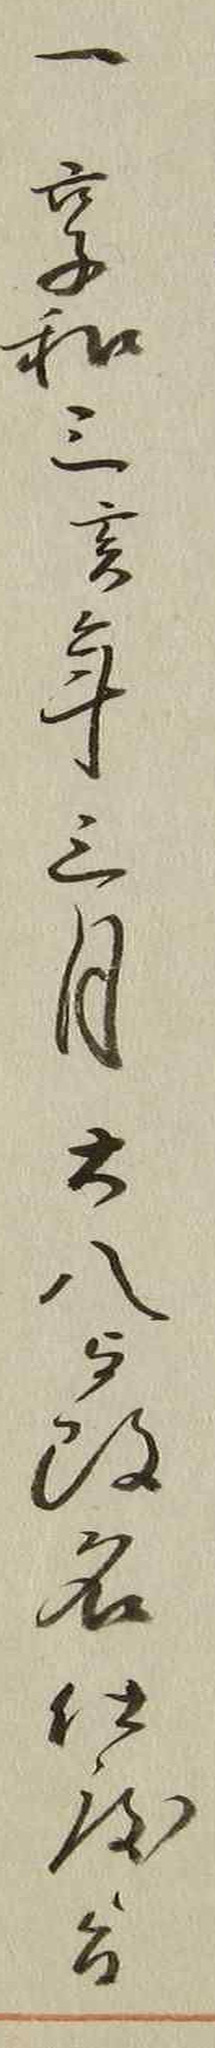一享和三亥年三月大八与改名仕度旨
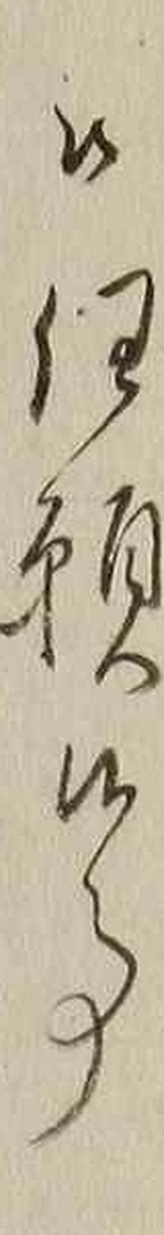被任願候事
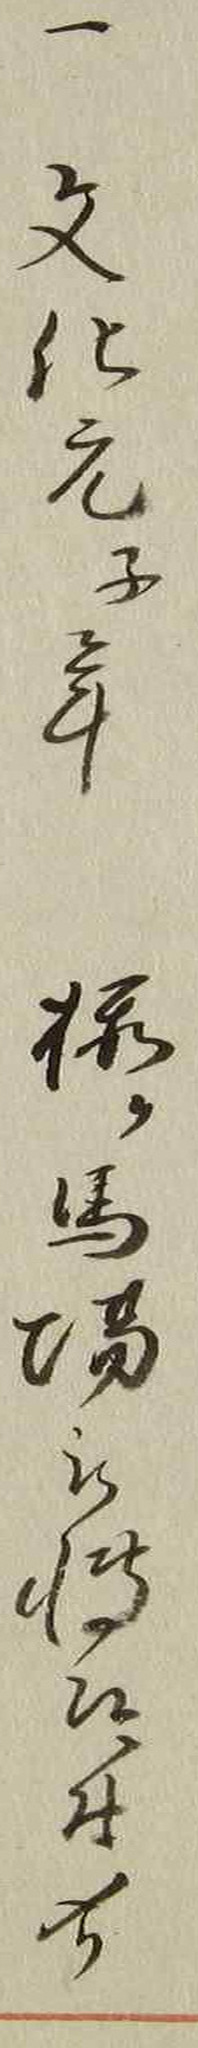一文化元子年桜ヶ馬場被転候ニ付〆り
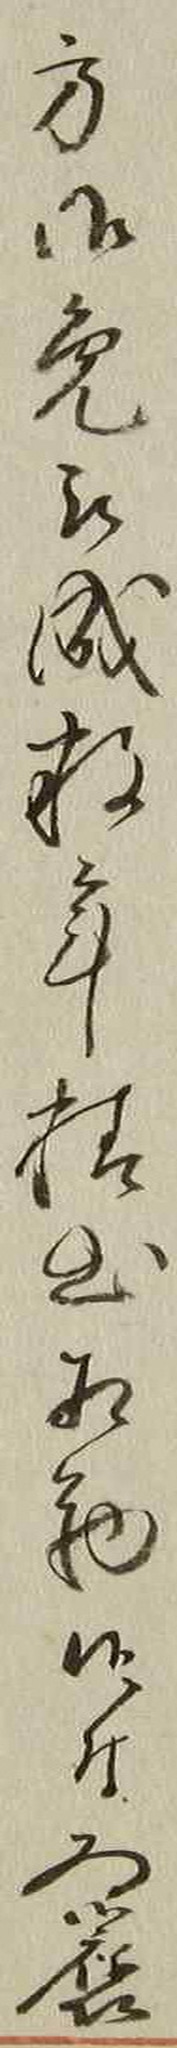方御免被成数年精出相勤候ニ付為御褒
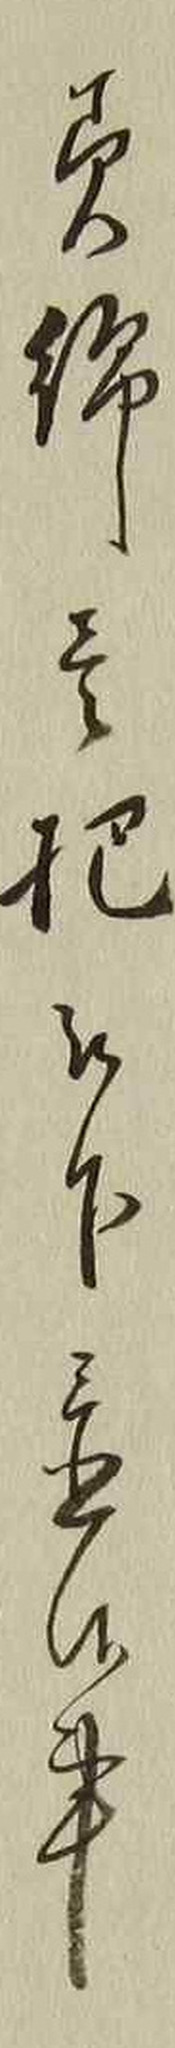美綿壱把被下置候事
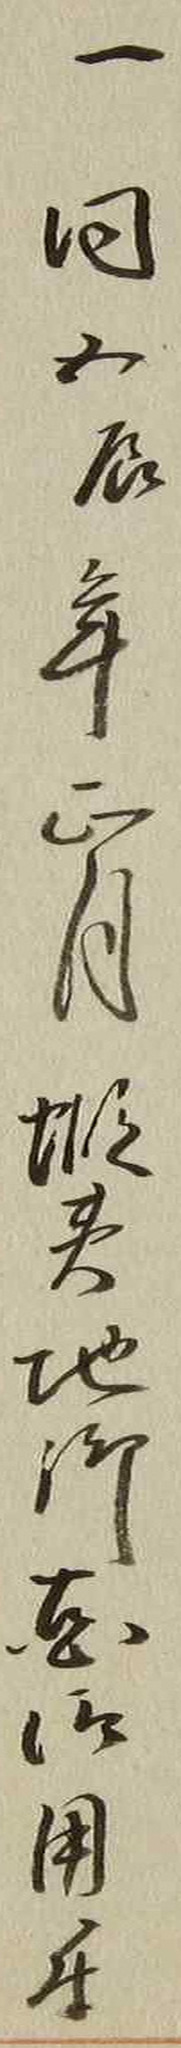一同五辰年正月蝦夷地御固御用ニ付
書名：諸士系譜　巻之122　よ之部5
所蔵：会津若松市立会津図書館
